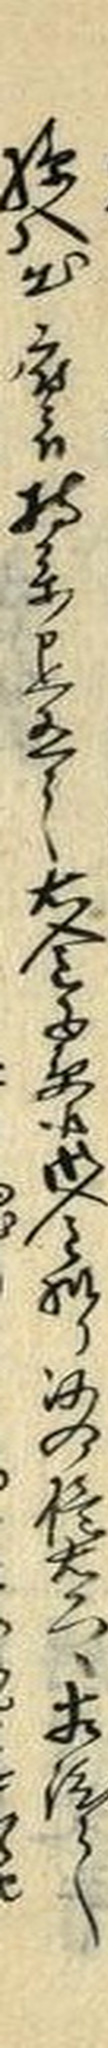孫八出府ニ付持参申上有之右金子受取御金掛り河合権右衛門へ相渡之
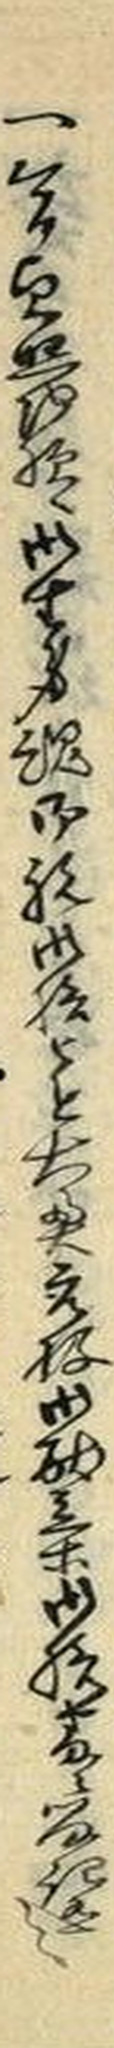一今日貞照院様へ御生身魂御祝御膳被進大奥取扱御献立等御膳番之留記有之
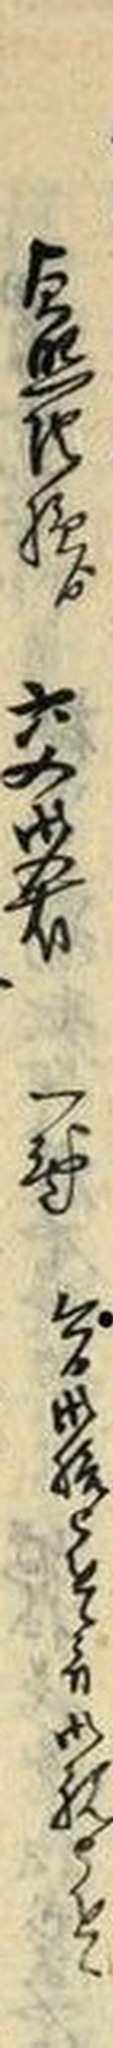貞照院様ゟ交御肴一台今日御膳被進候ニ付御祝被進候
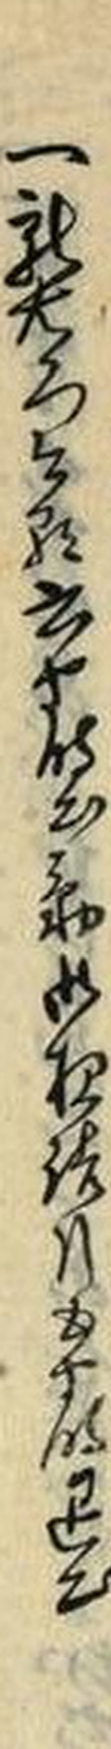一新右衛門今朝六半時出勤御夜詰引五半時退出

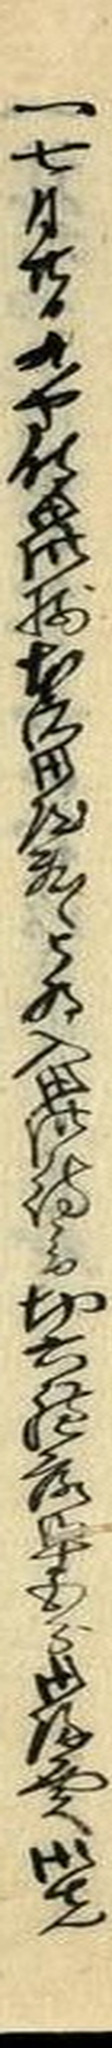一七月廿日半時御供揃本所御屋敷へ被為入御供待ニ而切六鎌落弐寸五分御帰殿御先
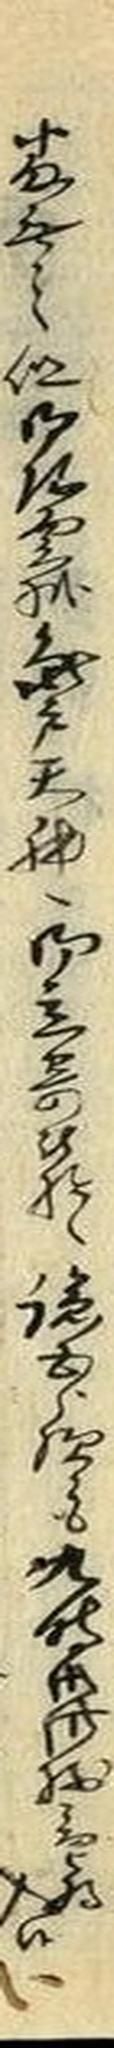番無之但御帰殿掛亀戸天神へ御立寄被遊候謙五郎様ニも九時御供揃ニ而被為入候
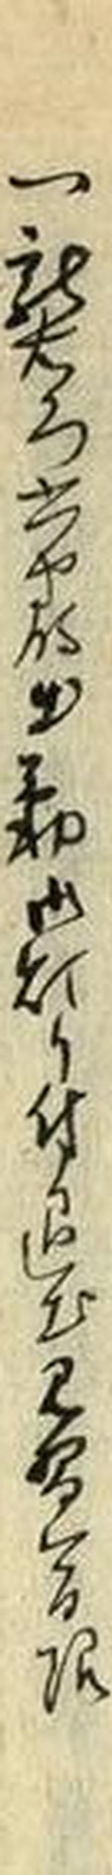一新右衛門六半時出勤御灯り付退出見習今日限
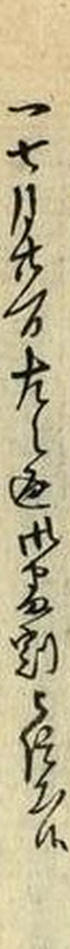一七月廿一日左之通御番割被仰出候
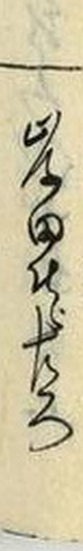岸田次郎左衛門
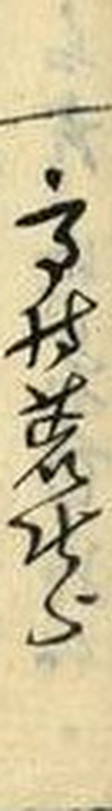高村荒次郎
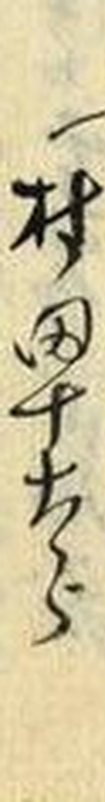村田十太郎
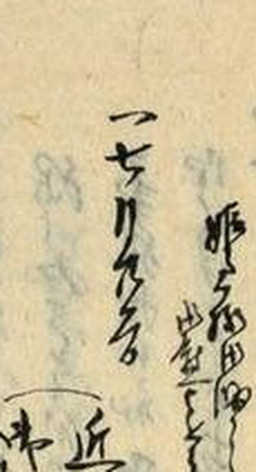一七月廿二日
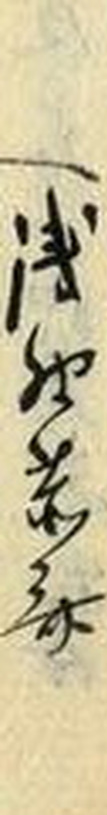浅野恭斎
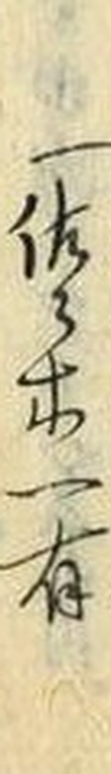佐々木一有
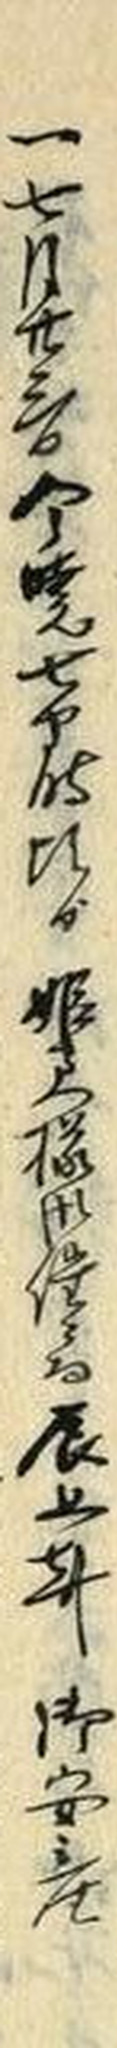一七月廿三日今暁七半時頃ゟ姫君様御催ニ而辰上刻御安産
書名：少傅日録抄（斉承付側向頭取日記、在府）
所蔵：福井県文書館 Fukui Prefectural Archives
